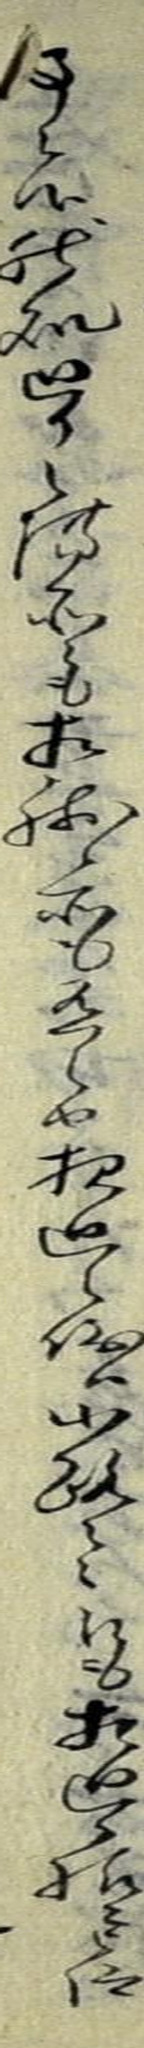事ニ候然処廻り之場所ニも相残候所も有之由夜廻之儀ハ小路々々江も相廻候様ニ被仰
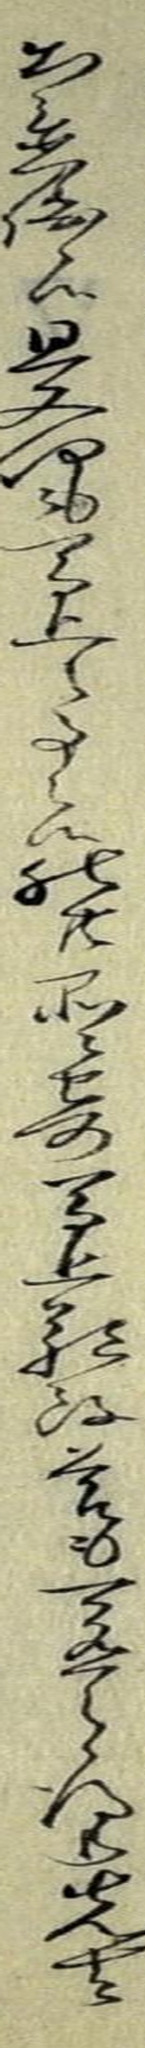出置儀ニ候且又何も馬上之事ニ候然共品ニ寄馬上難致節も可有之候得共先者
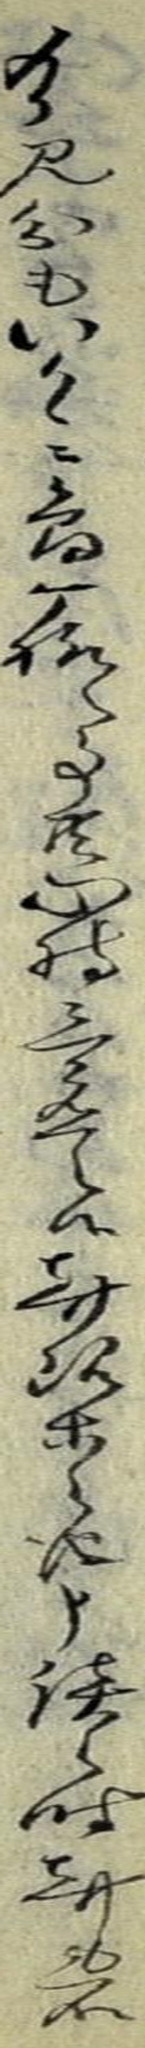〆り見分もいかゝニ候間ケ様之事共心持ニ可有之候刻限等之儀申談之時刻も不
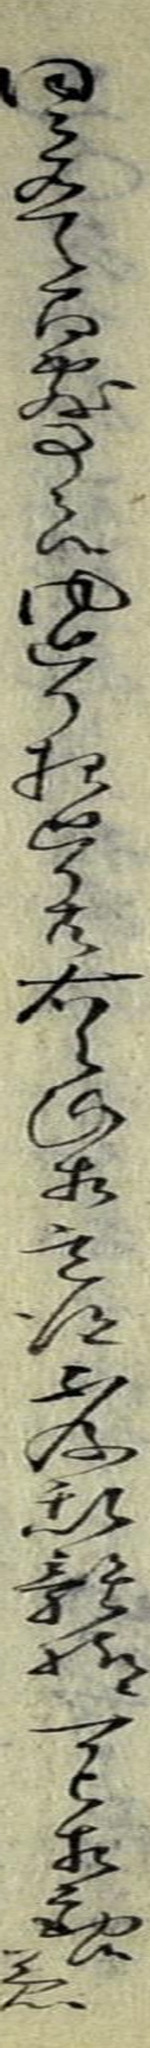同ニ有之間敷事ニ候風廻り夜廻り共右之趣相意得不及乱雑様ニ可被相勤候兼
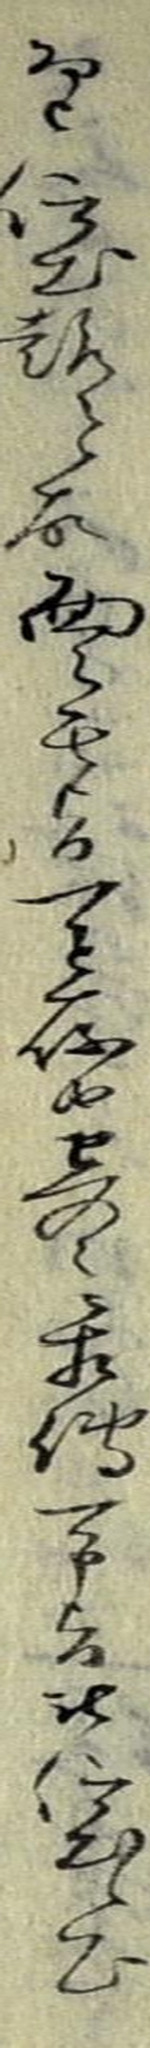而被仰出趣ニ候故面々其旨可被存由寄々ニ相伝可申旨被仰出候以上
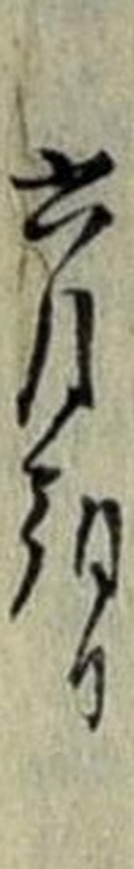六月朔日
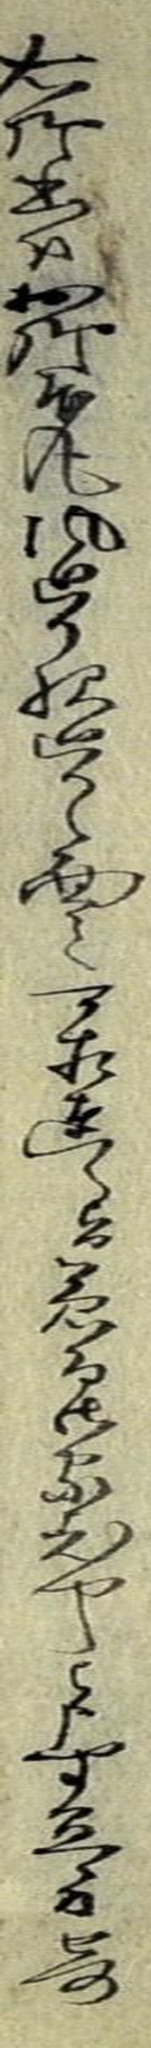右御書付於御本丸風廻り夜廻り之面々へ可相達之旨兼而御家老中被申聞置候付寄
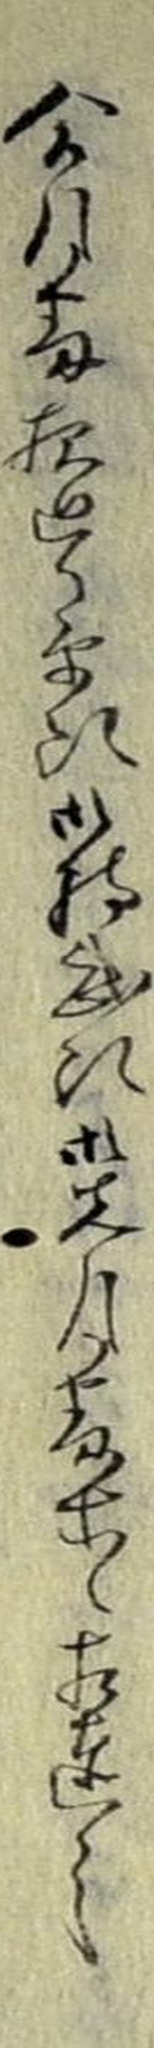合月番夜廻り筆頭御持武頭御先月番等へ相達之
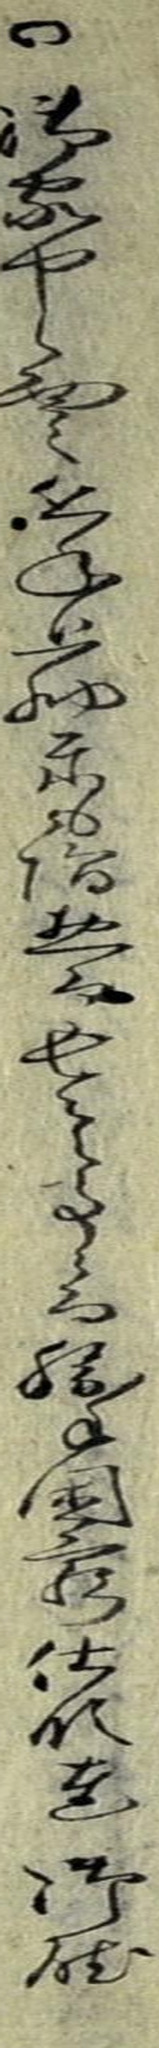〇御家中之面々近年上納米も増惣而長々之事ニ而勝手困窮仕段達御聴
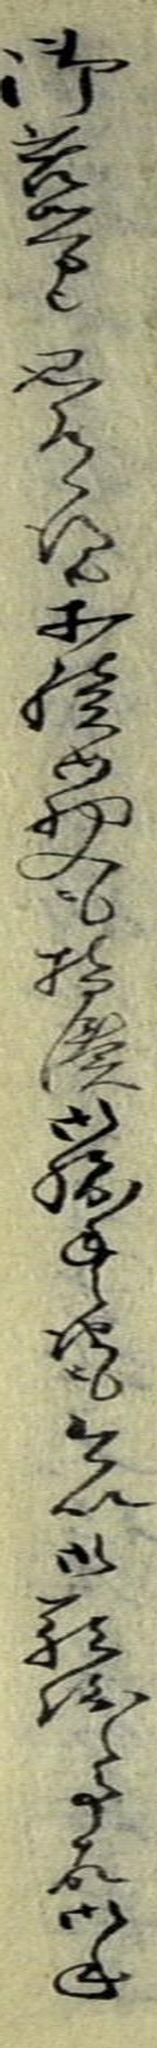御苦労被思召候得共打続御物入も指湊御勝手之儀も今以御難儀之事故御手

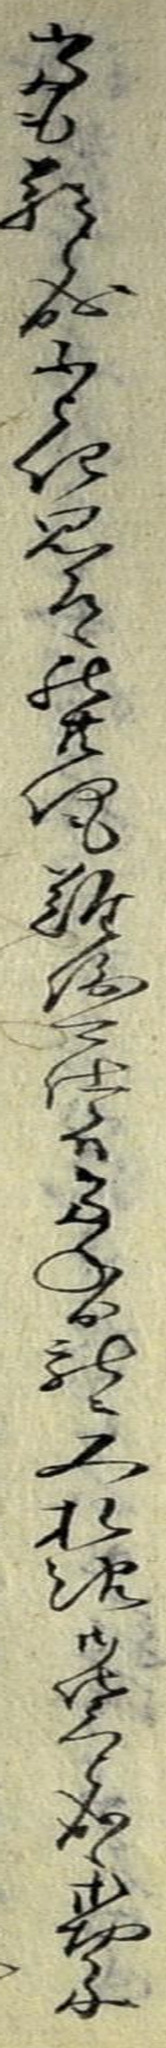当も難被成不被任思召候然共何も難儀可仕ニ付当年ゟ新ニ又札銀御貸被成候御切米
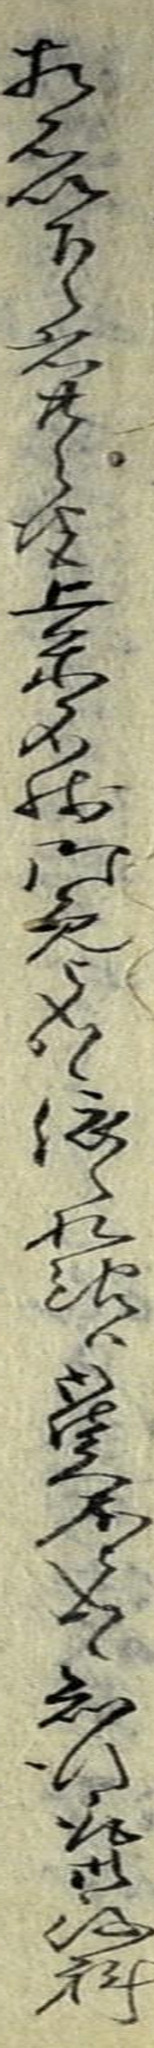拾石以下之者共之儀ハ上米不残御免被成候依之札銀ハ御貸不被成候知行取御役料
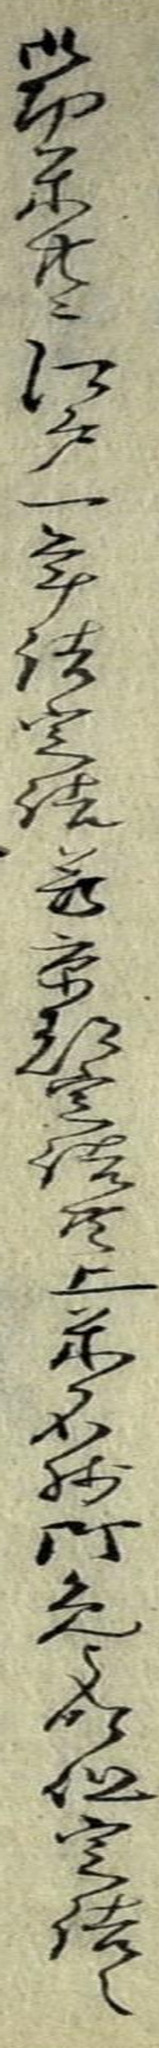御切米共ニ江戸一年詰定詰并京都定詰共上米不残御免被成候但定詰之
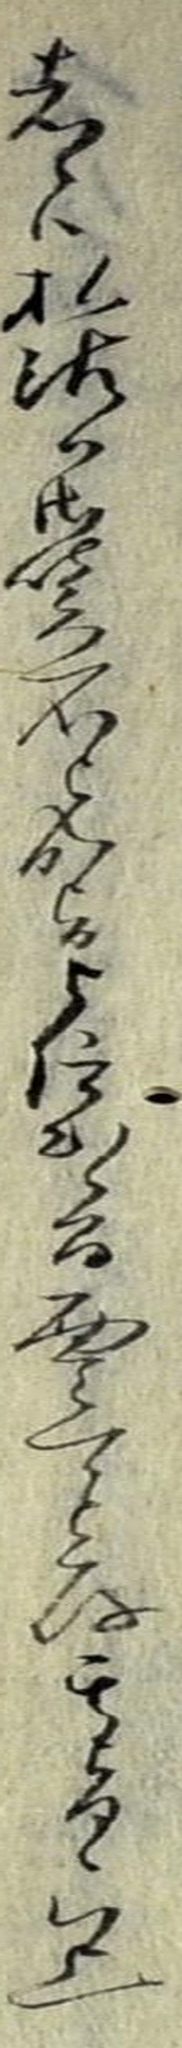者ヘハ札銀ハ御貸不被成旨被仰出候間面々可被存其旨候以上
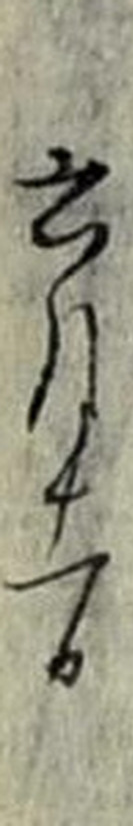六月十一日
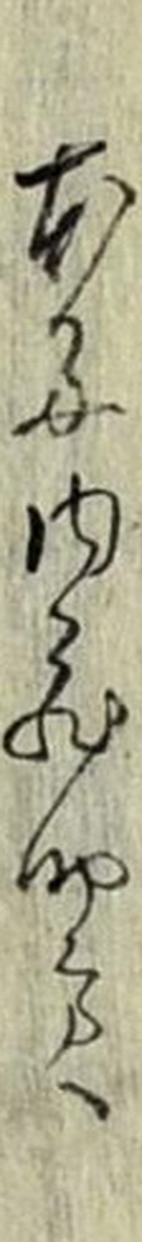本多内蔵助方へ
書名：命令之部 一
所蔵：福井県文書館 Fukui Prefectural Archives
